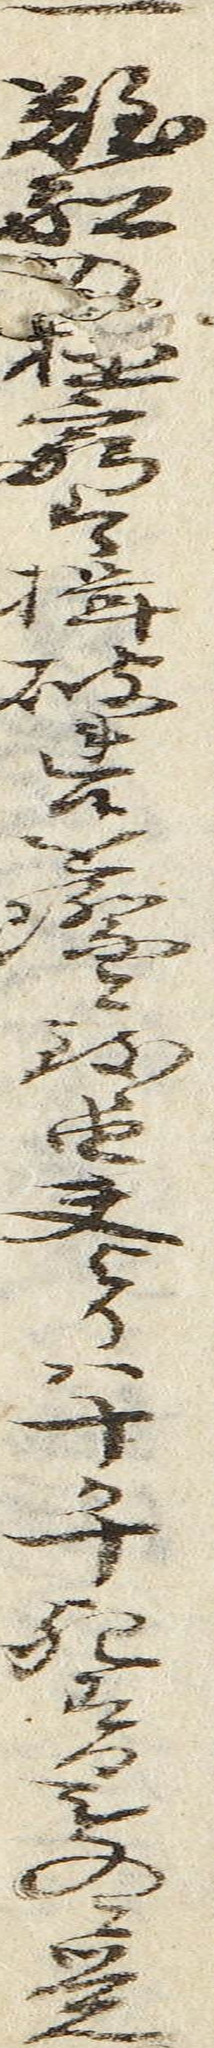一難船の極窮は揖破れ候を際と致候由夫よりは十か十死するものと覚
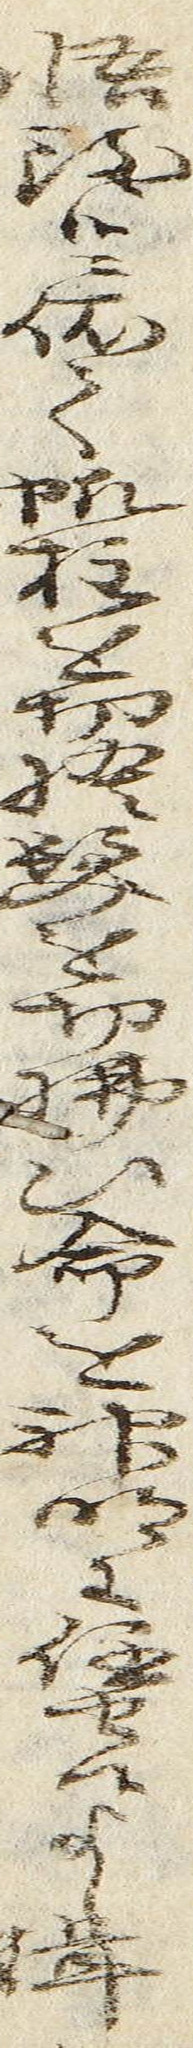悟致候に依て帆柱を切捨髪を切払ひ命を神明に任せ候よし揖
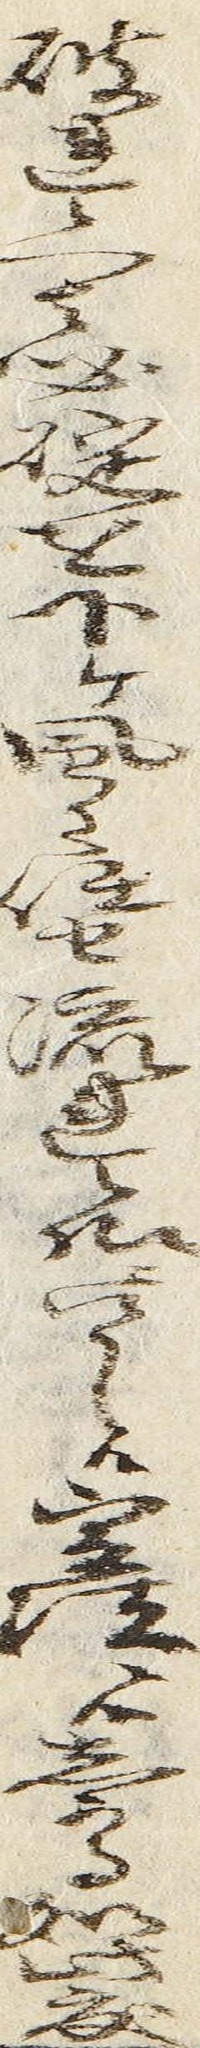破れ候へ者必碇を下ヶ風に任せ流れ候様にいたし候定法にはしかる処此度
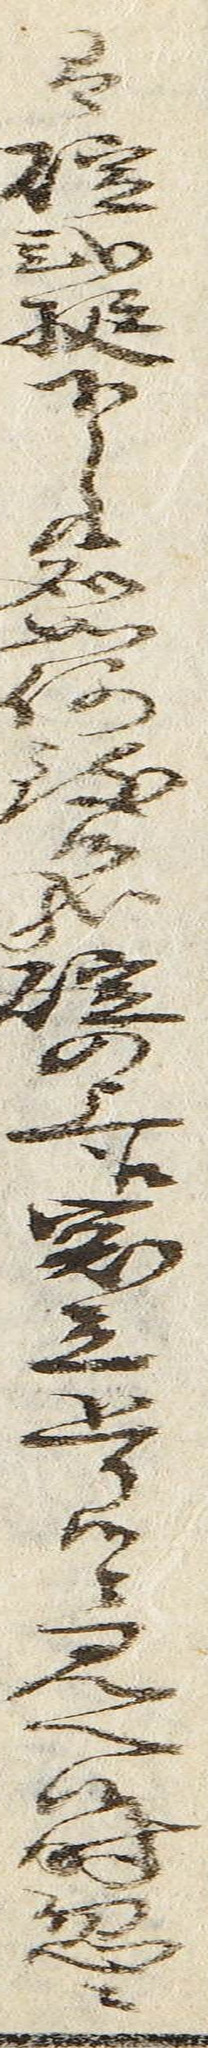は碇弐挺下し候処如何致候哉碇の上江突立上り候と見へ候時忽に
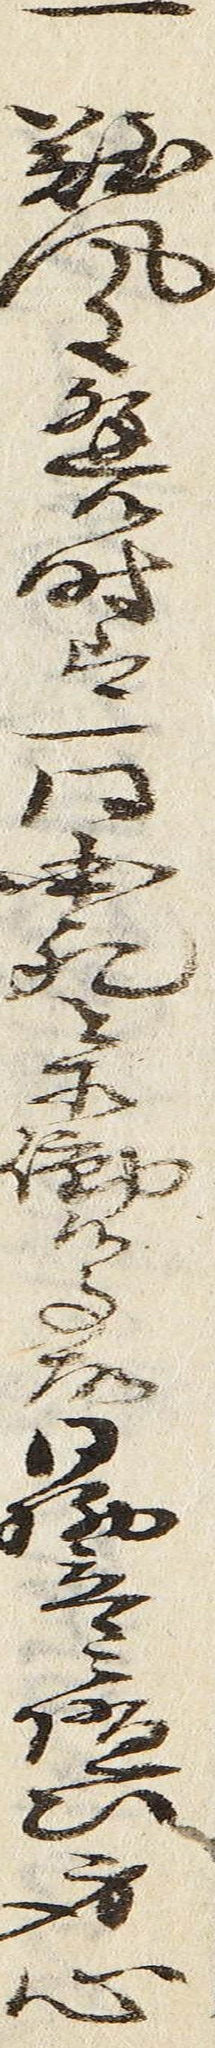一難風に逢候時は一同必死と相働候事故日柄立候に随ひ身心
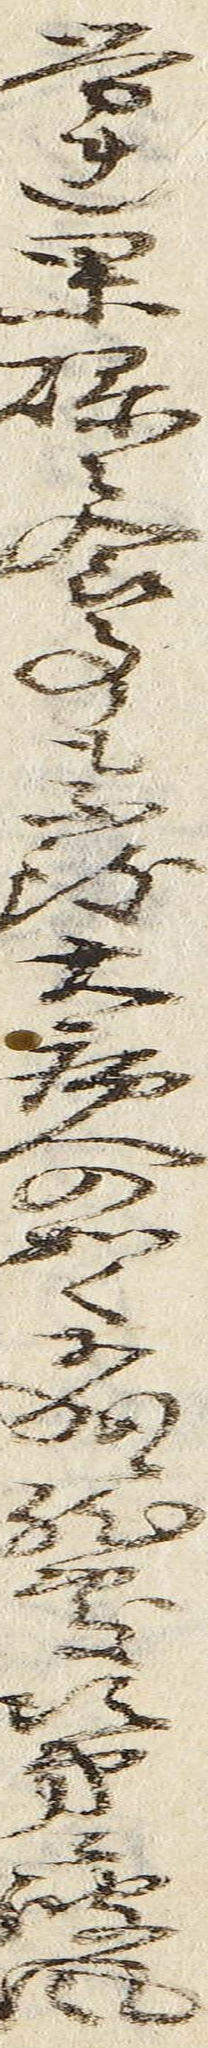労れ果碌々食事も不致大病人の如く相成候然処次第に波風
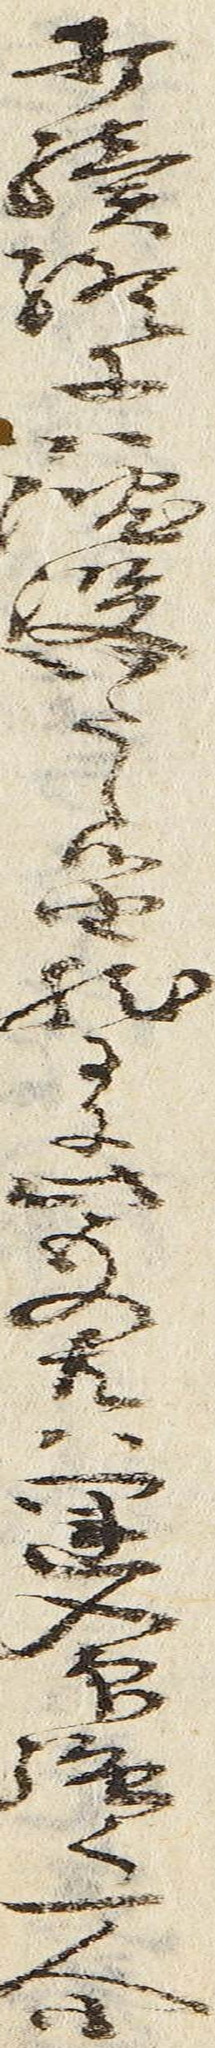打続終には沈没いたし候由然るに此もの共は運命強く一人も
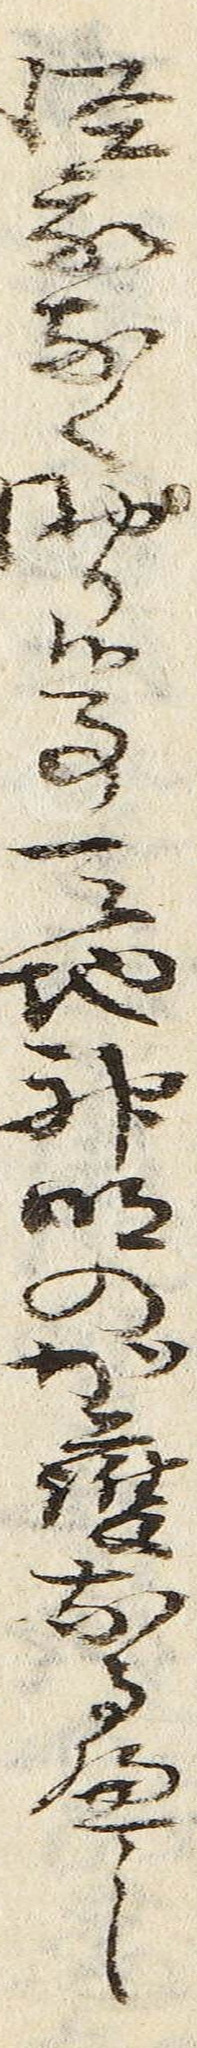怪我なく助り候事一に地神明の加護なるへし
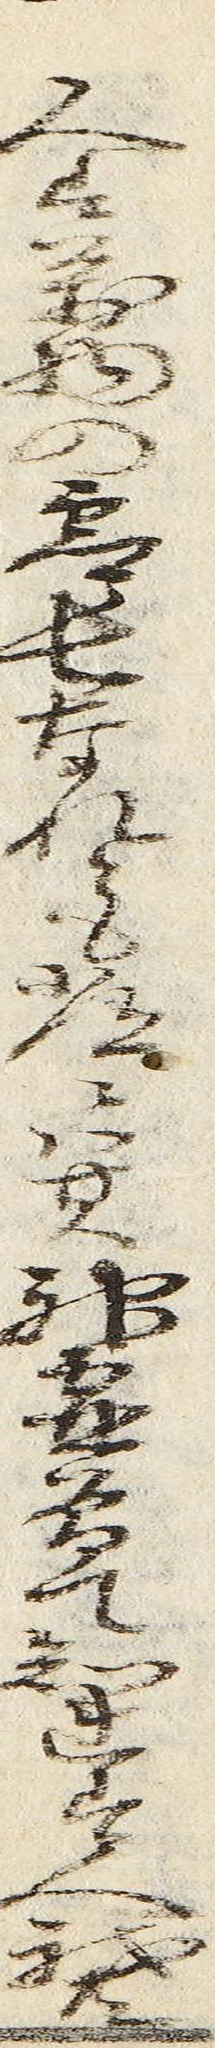一人は万物の霊長なれとも常には其神霊曽て知れは人我共
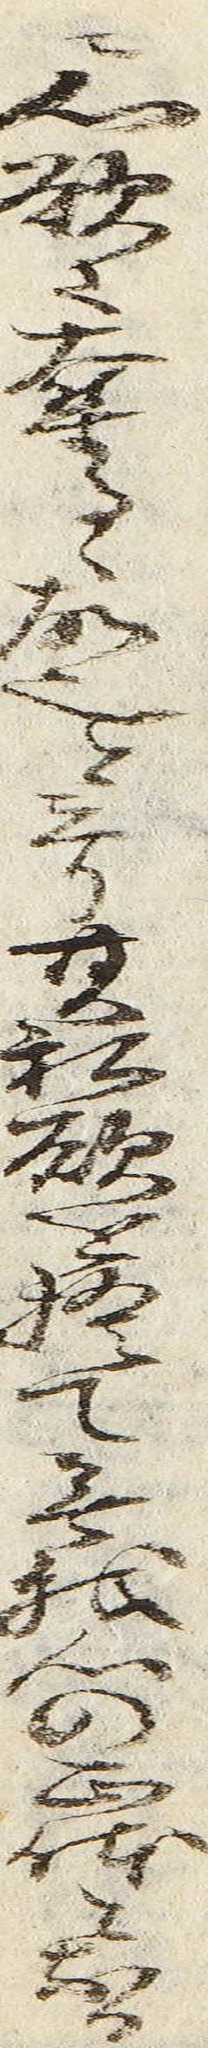に心欲に奪るゝ故也と云り其私欲を捨て無我心の正体となる
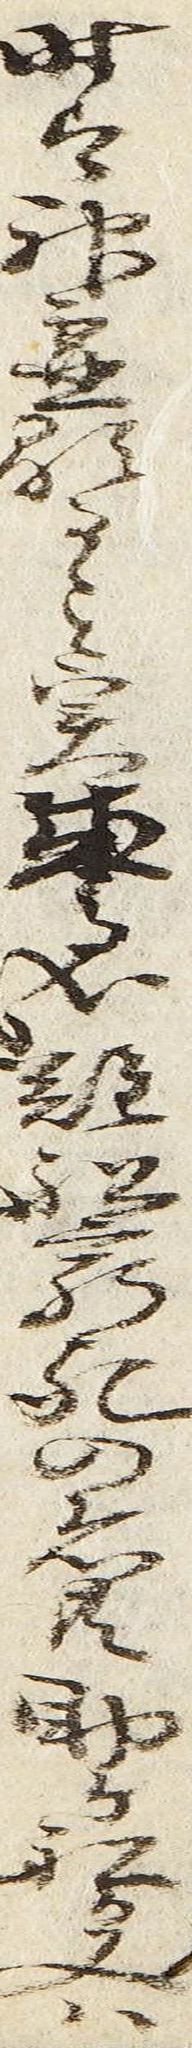時は神霊顕るゝと実成る哉難船窮死の者共助ヶ船か又は
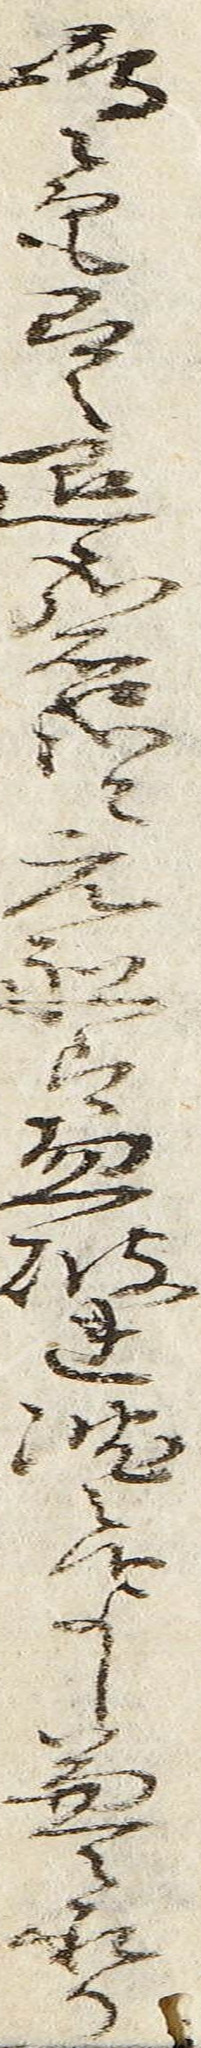島に而も有之退候哉否哉と元船は忽破れ沈み候よし兼々承り
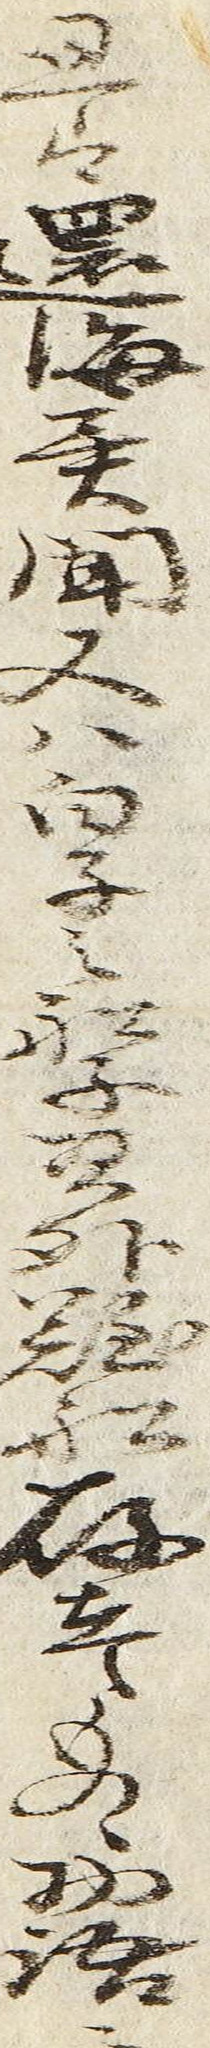且は還海異聞又は白子之船子其外難船存在ものゝ物語に
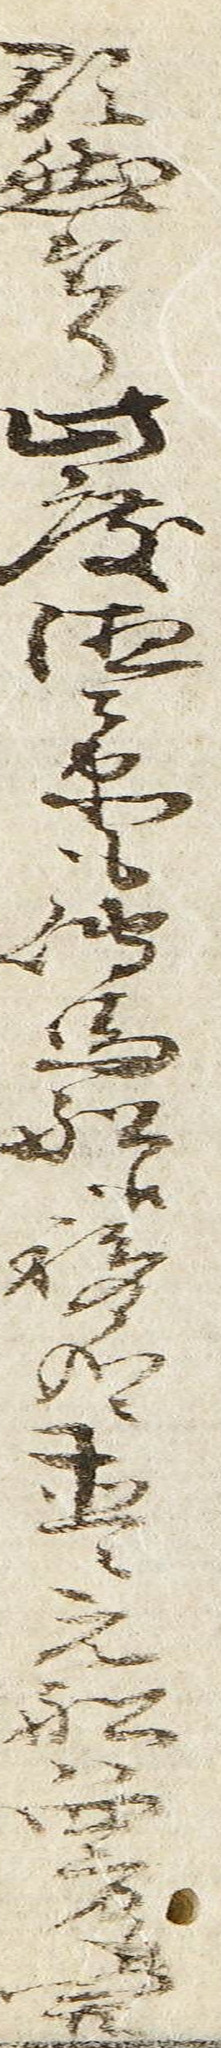顕然たり此度徳兵衛も伝馬船江移哉と直にも元船は四方江開
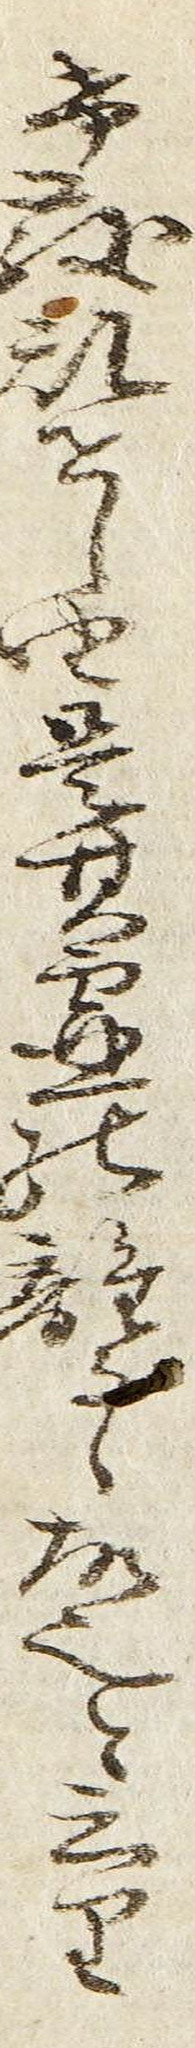き散乱せし由是其霊の離るゝ故也と云り
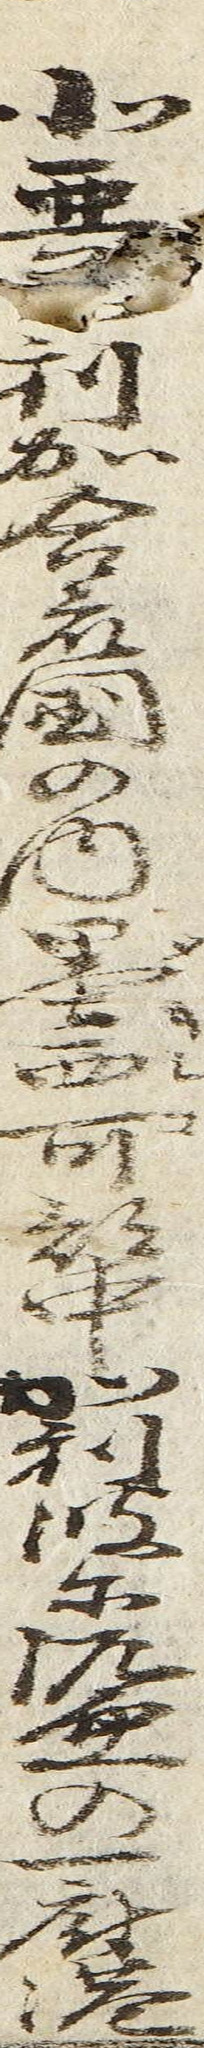一北亜米利加合衆国の内墨西可部中加利波尓泥亜の一府港
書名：漂流夢物語
